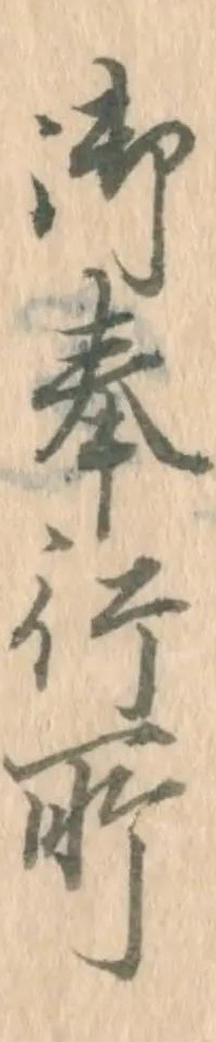御奉行所

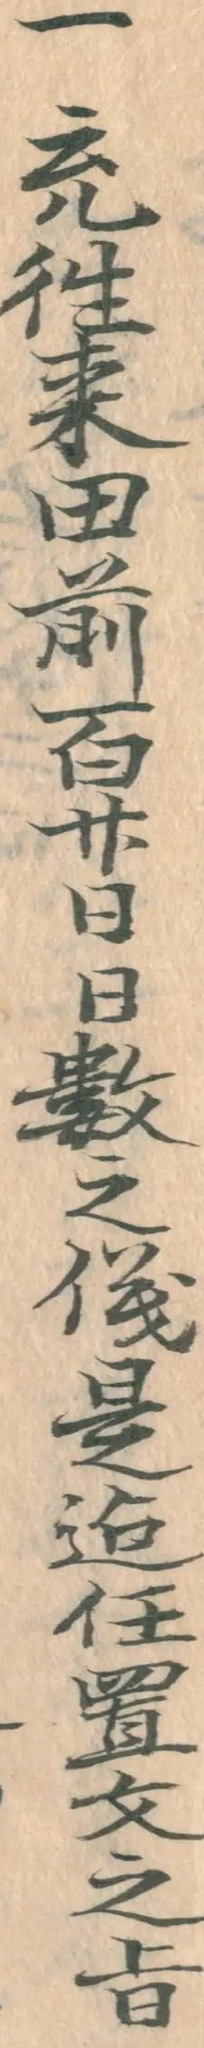一、充往来田前百廿日日数之儀是迄任置文之旨
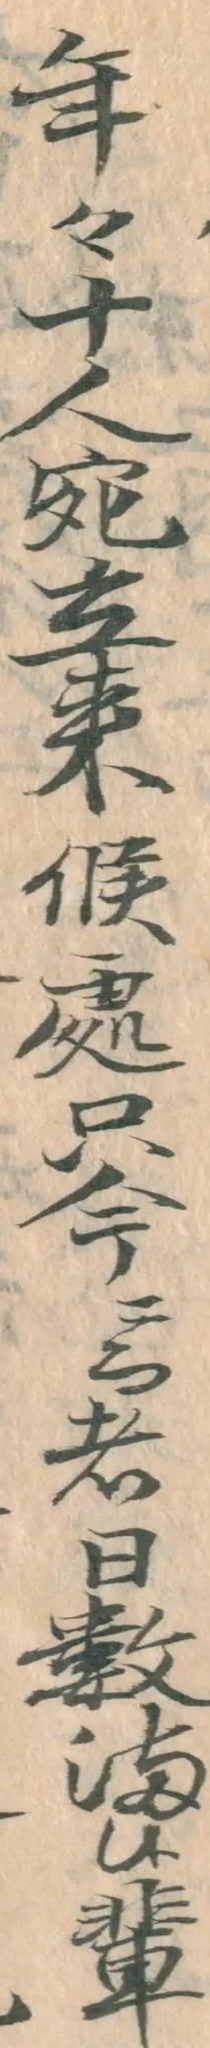年々十人宛立来候處只今ニ而者日数満候輩
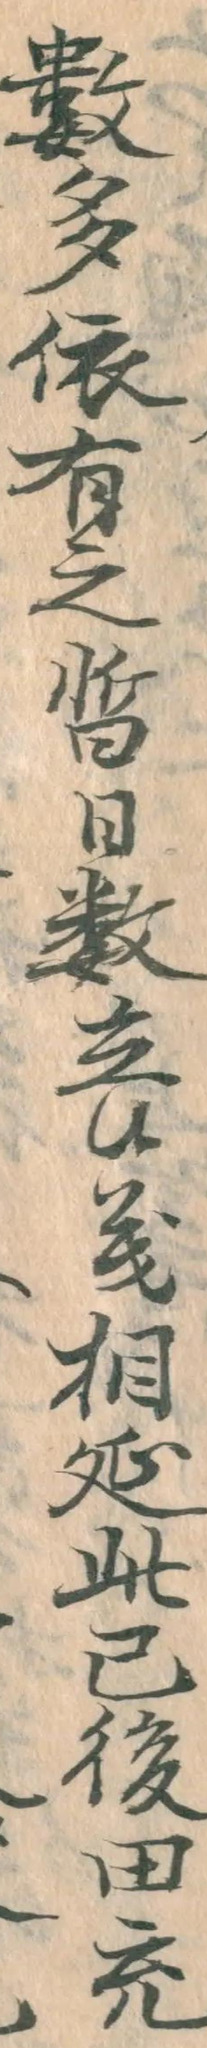数多依有之暫日数立候義相延此已後田充
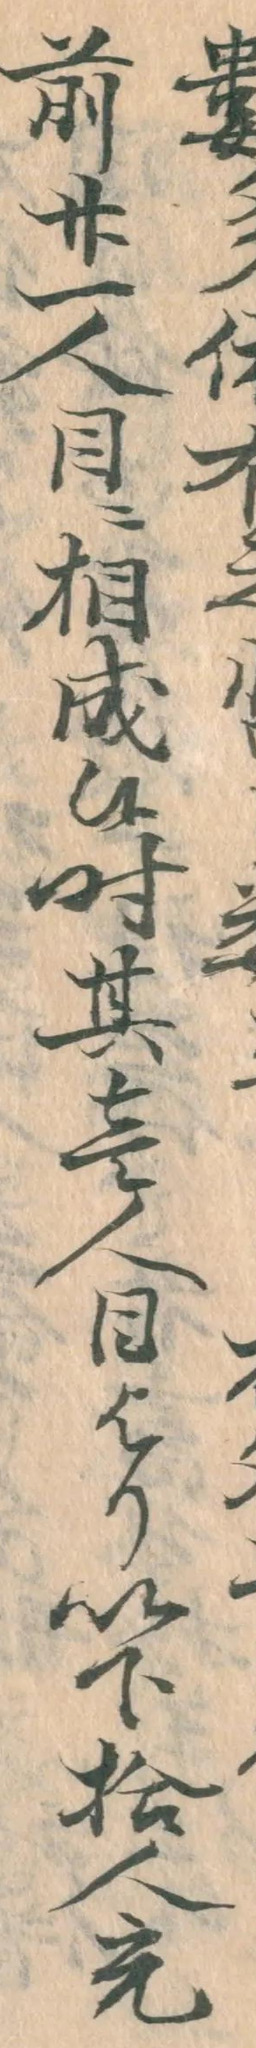前廿一人目ニ相成候時其壱人目より以下拾人充
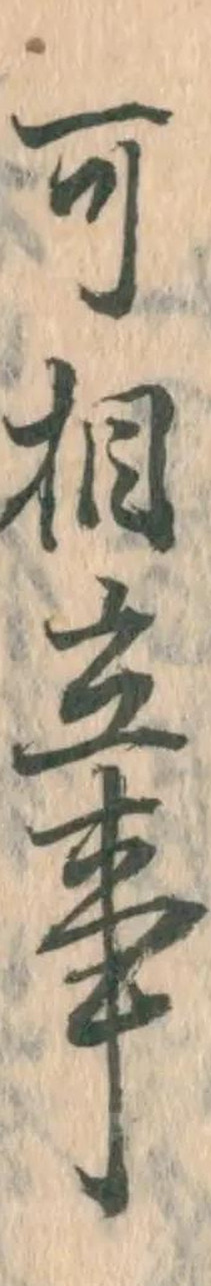可相立事
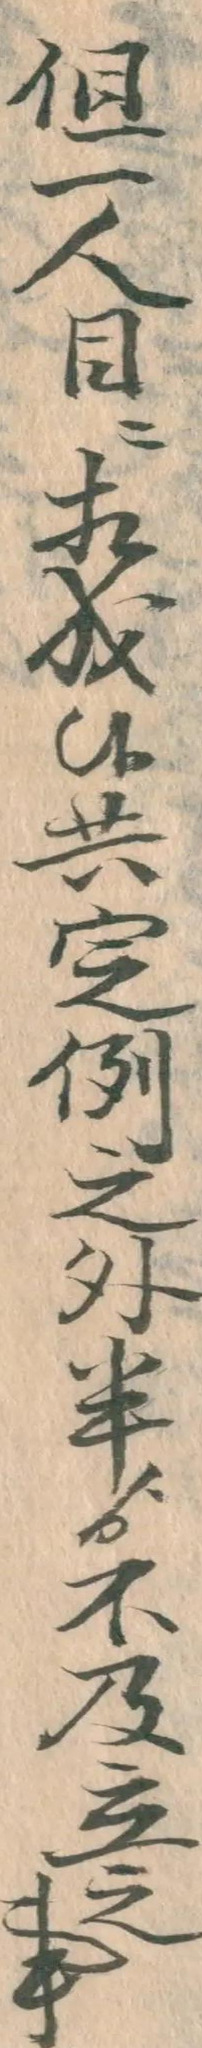但一人目ニ相成候共定例之外半ゟ不及立之事
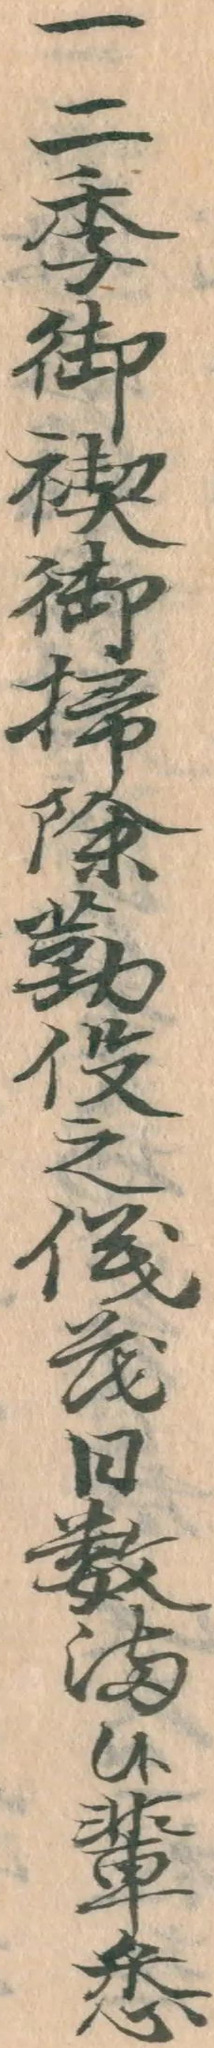一、二季御禊御掃除勤役之儀も日数満候輩悉
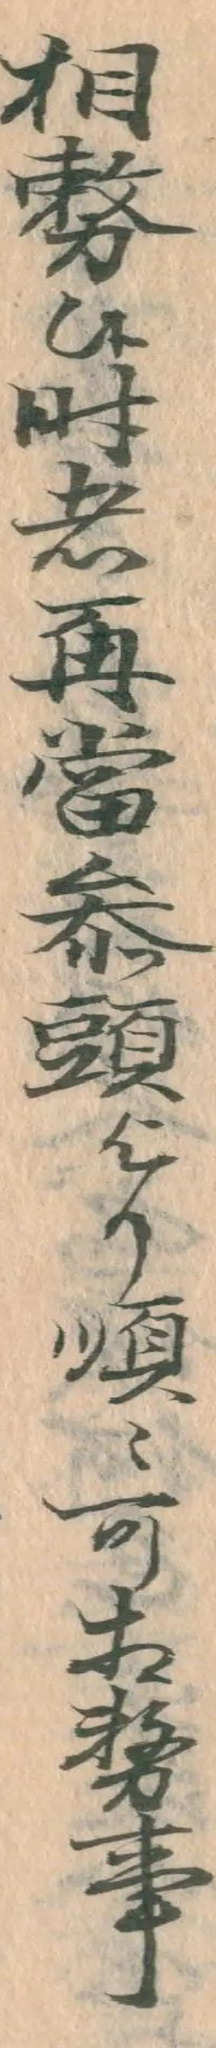相務候時者再當参頭より順々可相務事
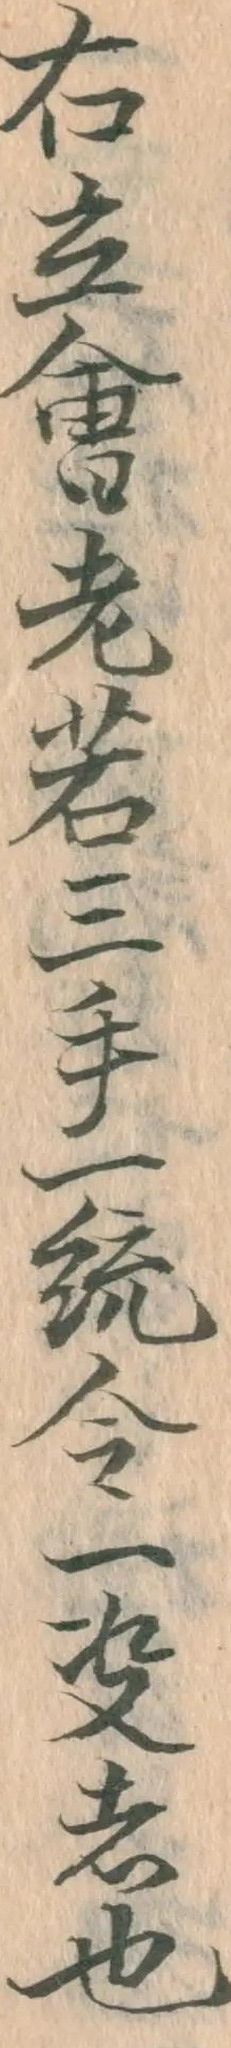右立會老若三手一統令一決者也
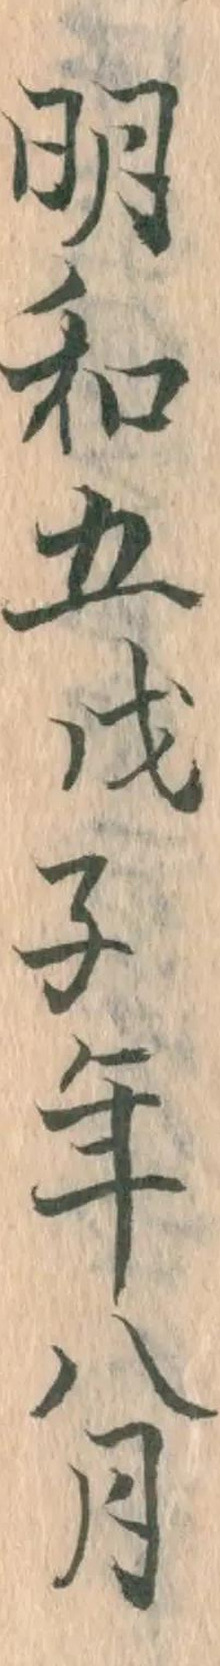明和五戊子年八月
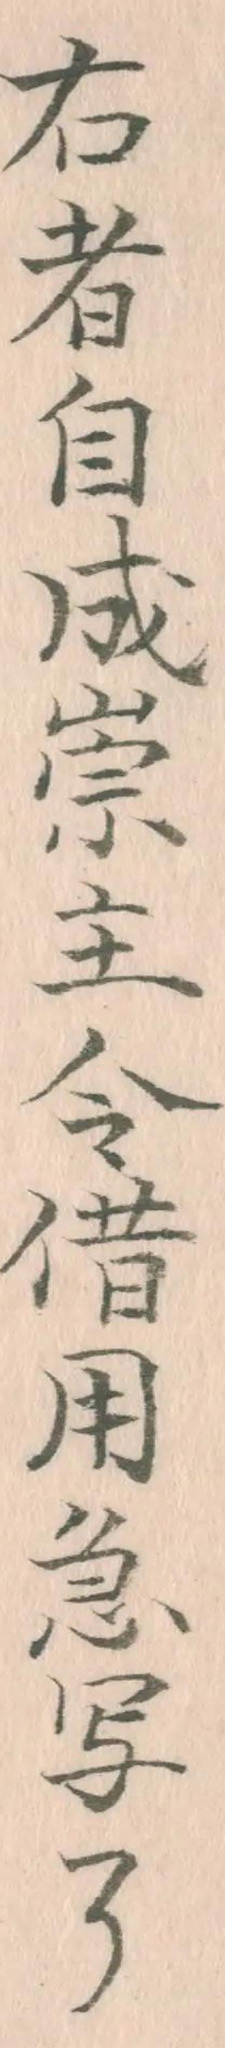右者自成崇主令借用急写了
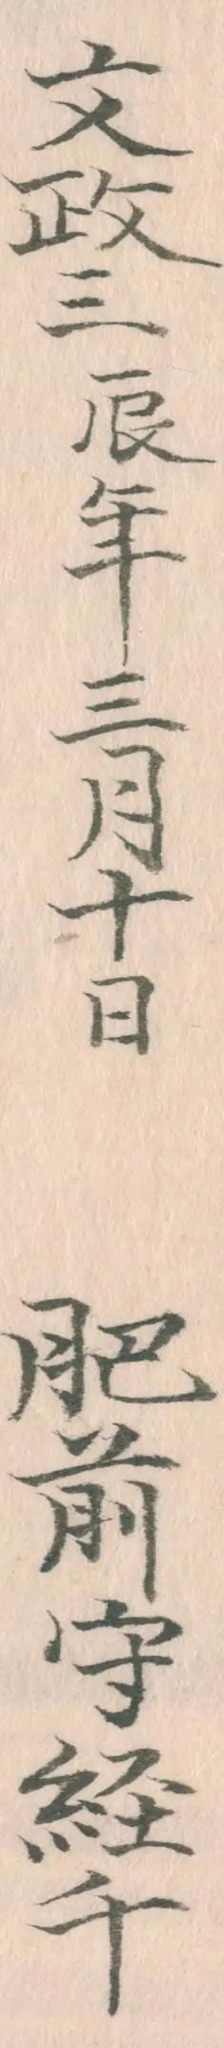文政三辰年三月十日肥前守経千

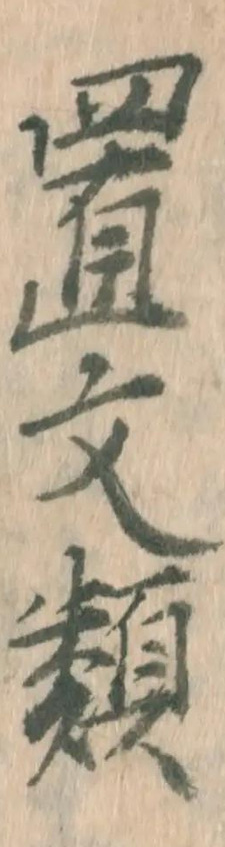置文類

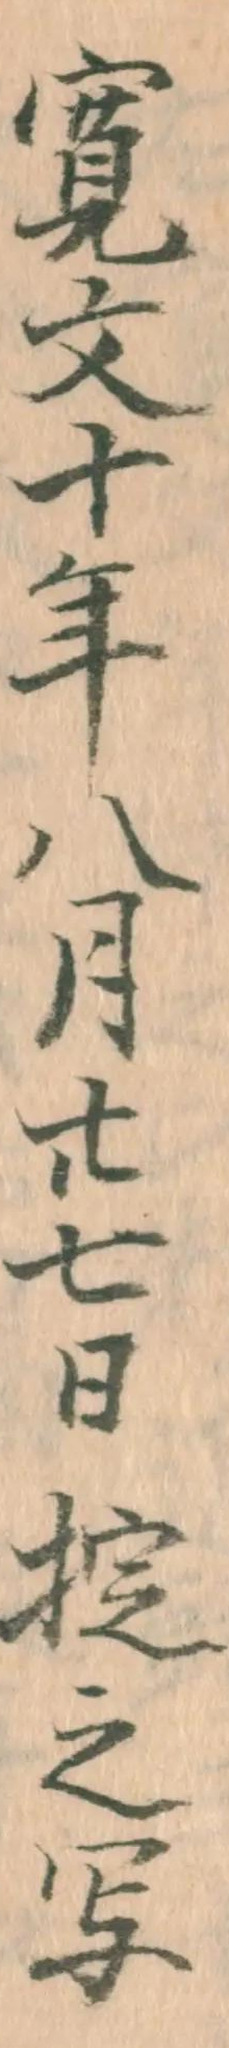寛文十年八月廿七日之写
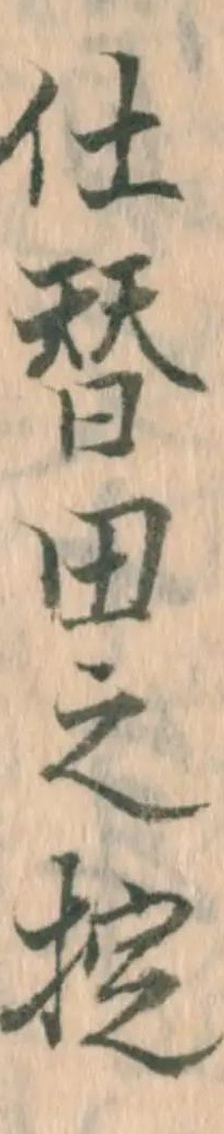仕替田之掟
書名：賀茂社記録. 第39冊
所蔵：国立国会図書館 National Diet Library, JAPAN
